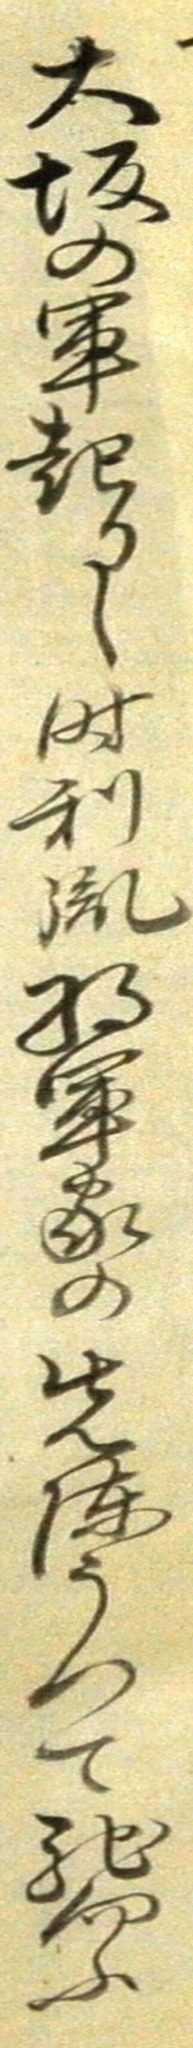大坂の軍起りし時利胤将軍家の先陣うつて馳向ふ
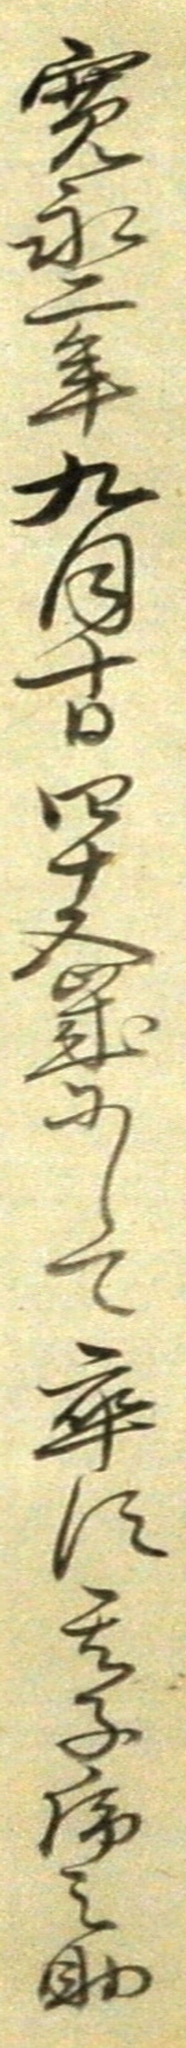寛永二年九月十日四十五歳にして卒す其子虎之助
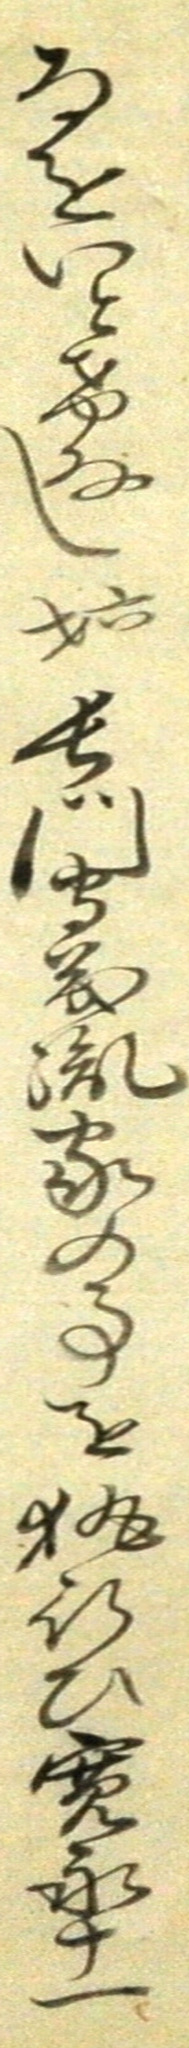なをいとけなし六才長門守義胤家の事を執行ひ寛永十一
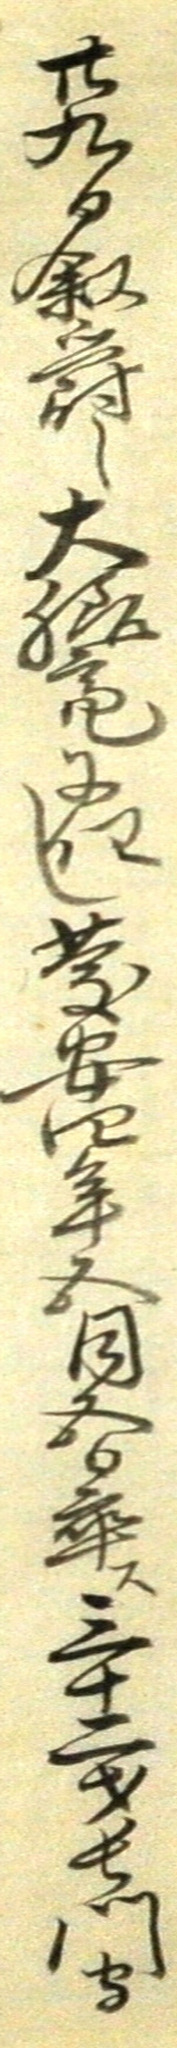廿九日叙爵し大膳亮に任し慶安四年五月五日卒ス三十二才長門守
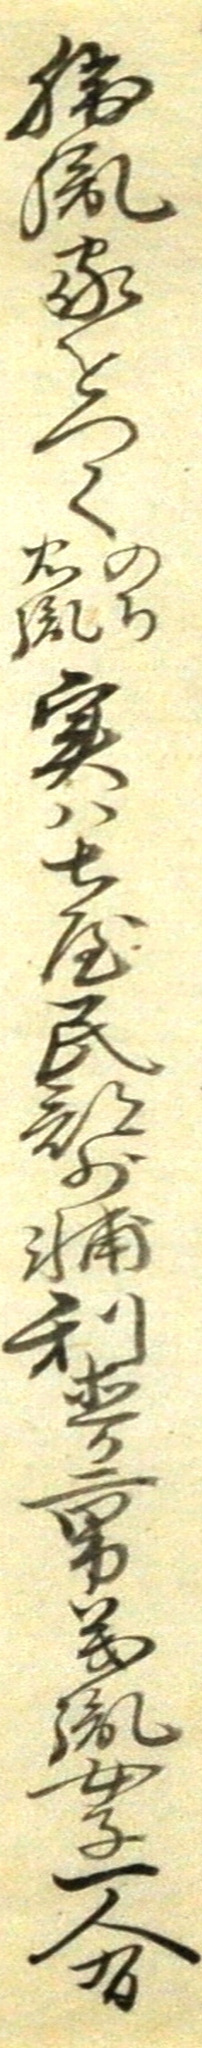勝胤家をつくのち忠胤実は土屋民部少輔利直か二男義胤女子一人有
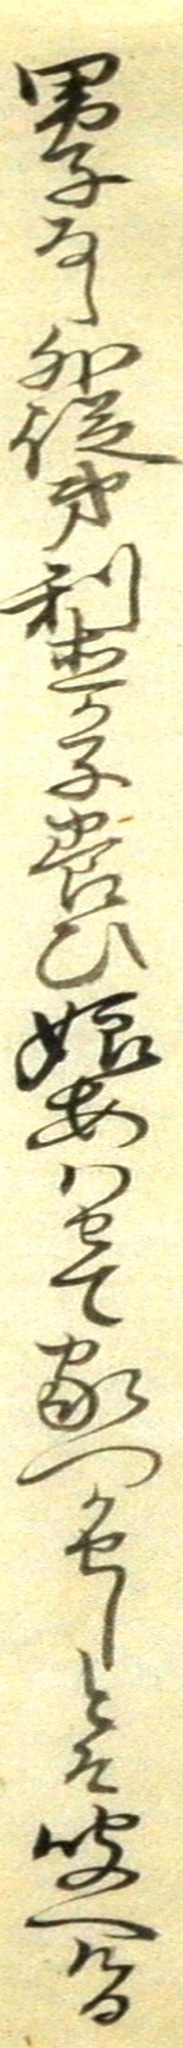男子なし外従弟利直か子養ひ娘あはせて家つかせしとそ聞へける
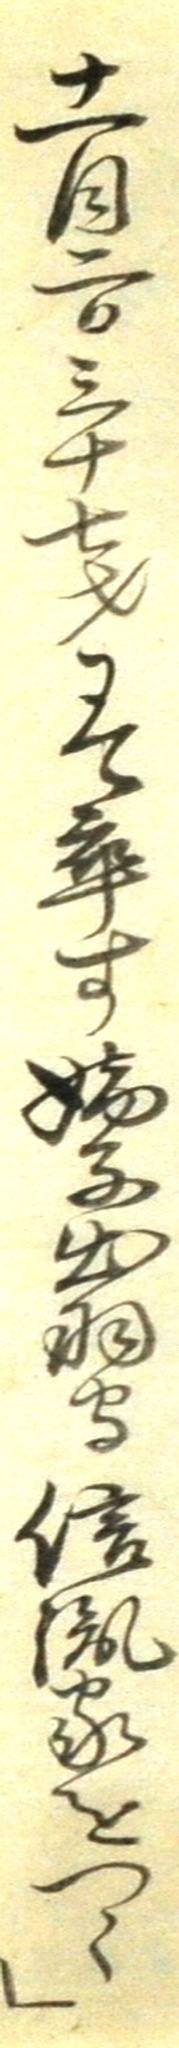十一月二日三十七才にて卒す嫡子出羽守信胤家をつく」
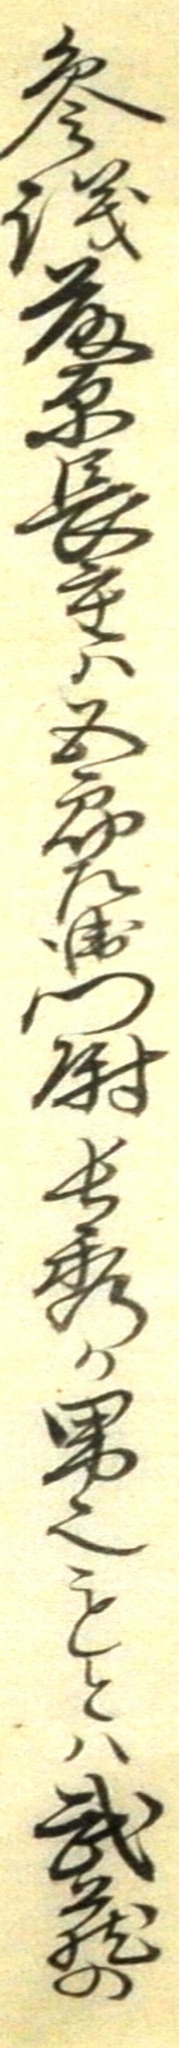参議藤原長重は五郎左衛門尉長秀か男也もとは武蔵の
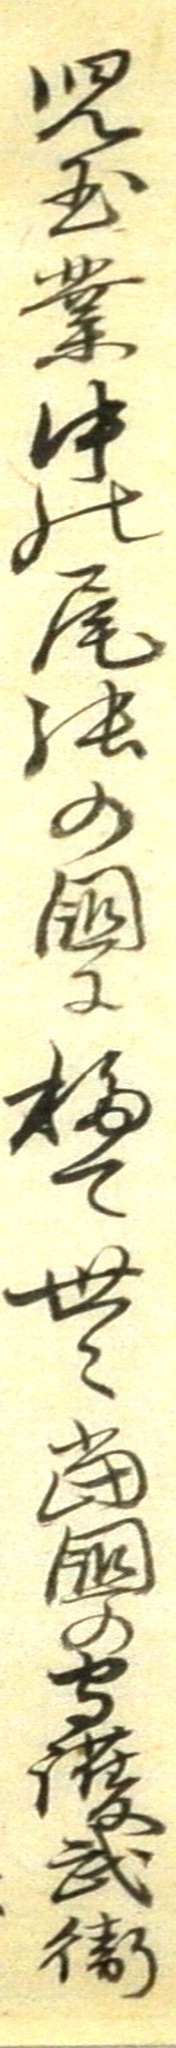児玉業中の尾張の国に移て世々当国の守護武衛
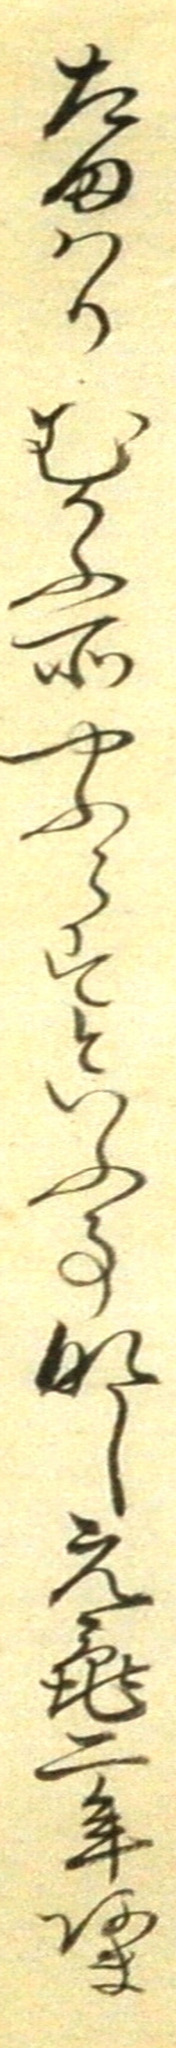たまはりむかふ所やふらすといふ事なし元亀二年あま
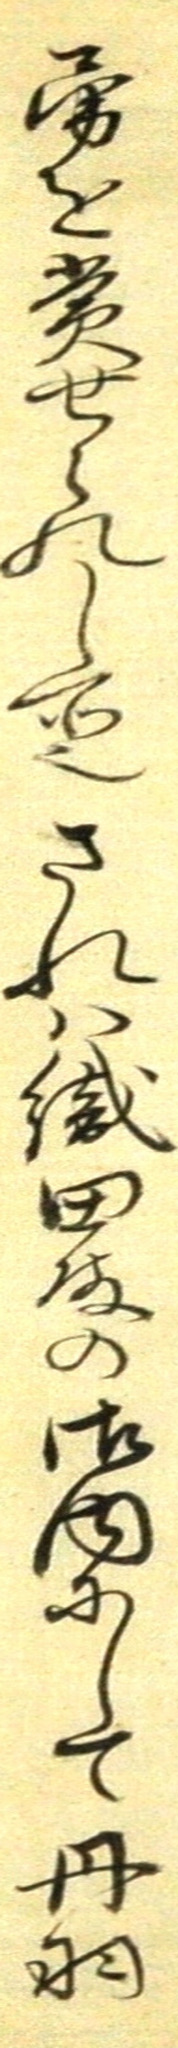勇を賞せられし所也されは織田殿の御用にして丹羽
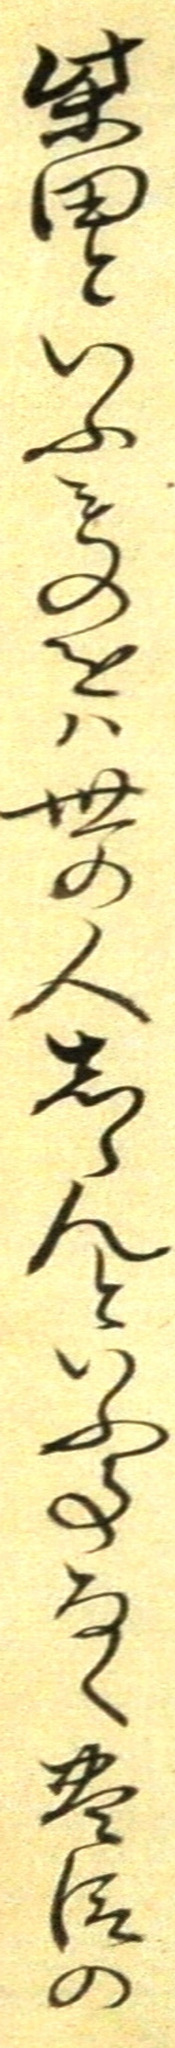柴田といふものをは世の人しらんといふ事なく豊臣の

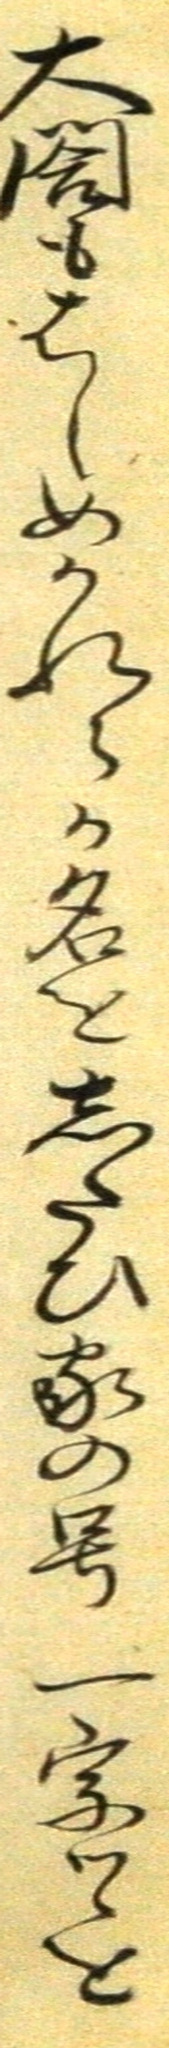太閤もはしめかれらか名をしたひ家の号一字ツヽを
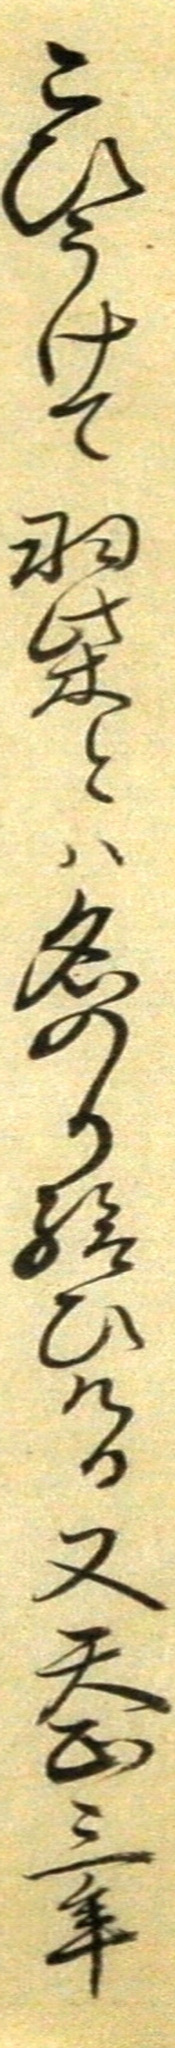こひうけて羽柴とは名のり給ひける又天正三年
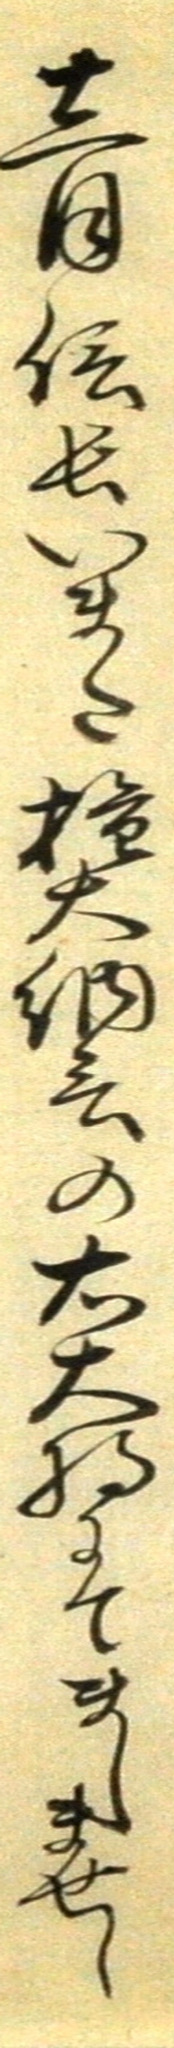十二月信長いまた権大納言の右大将にてましませし
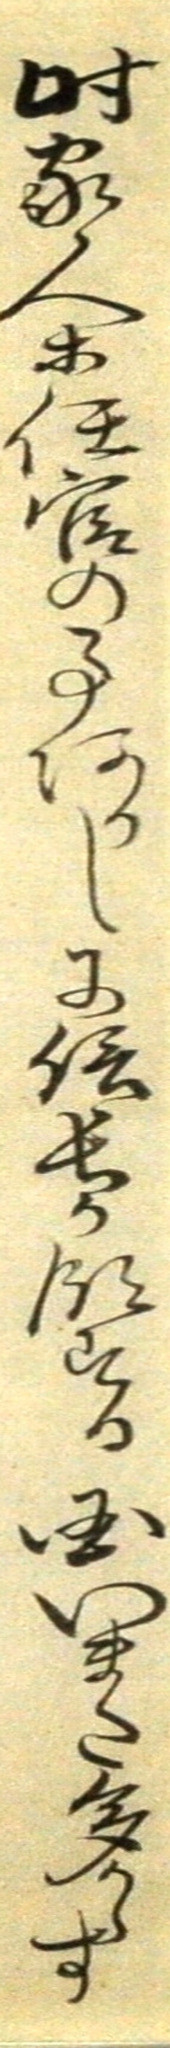時家人等任官の事ありしに信長か領する国いまた多からす
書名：藩翰譜（八・下）
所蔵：伊那市立高遠町図書館・合同会社AMANE
